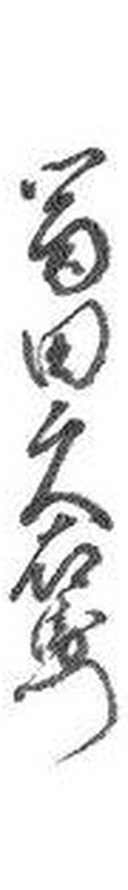冨田久右衛門
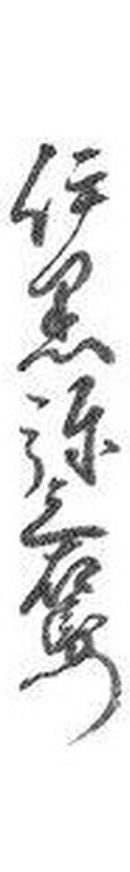伊黒弥三右衛門
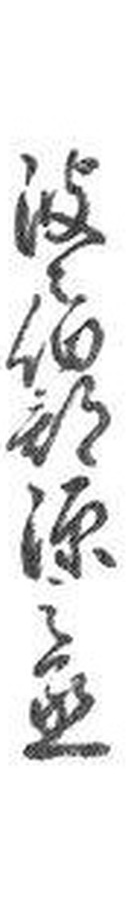波々伯部源之丞
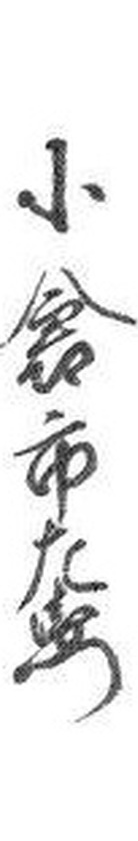小倉市左衛門
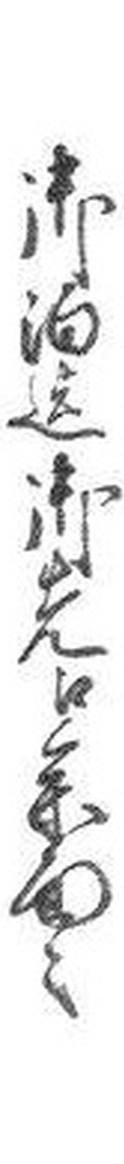御泊迄御先江参面々
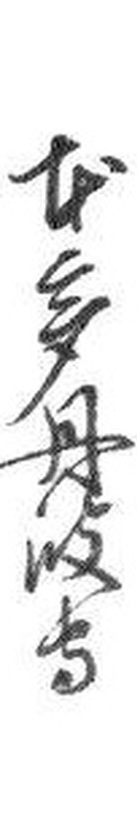本多丹波守
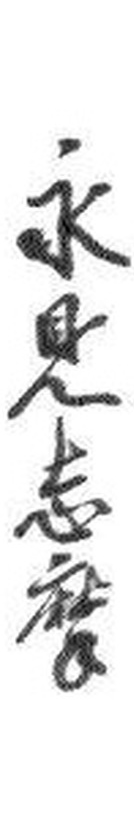永見志摩
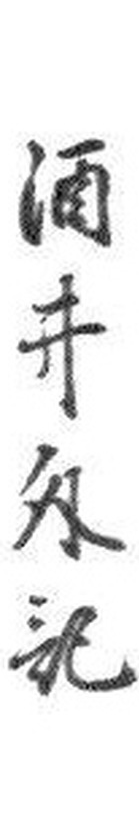酒井外記
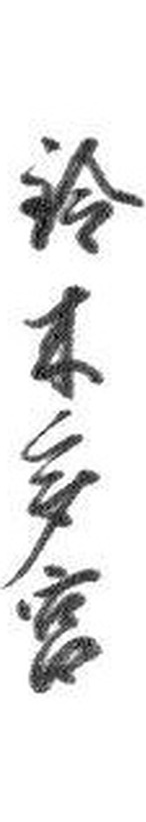鈴木多宮
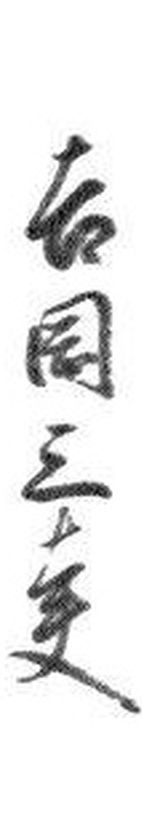吉岡三太夫
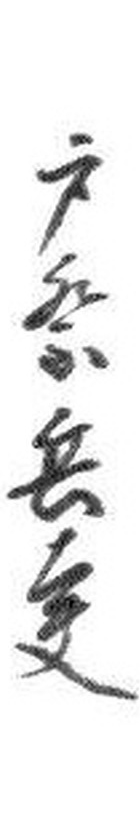戸祭兵太夫
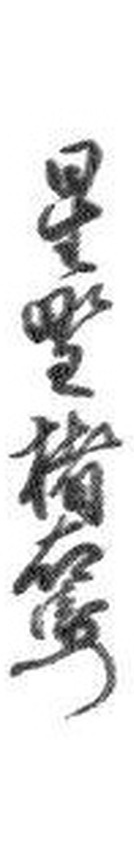星野猪右衛門
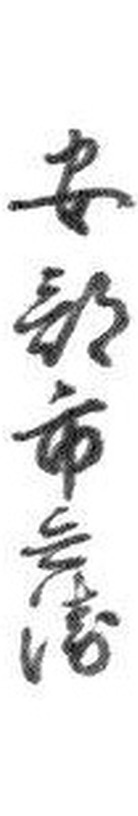安部市兵衛
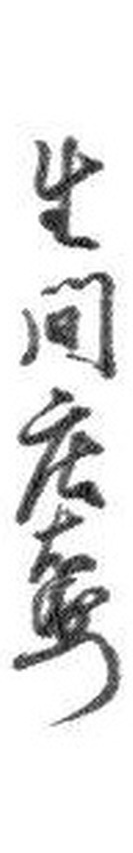生間庄右衛門
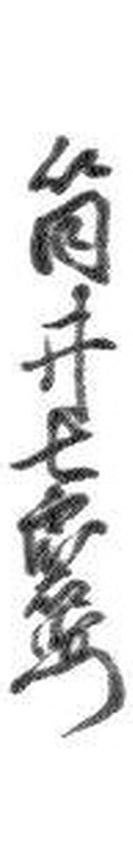筒井七郎右衛門

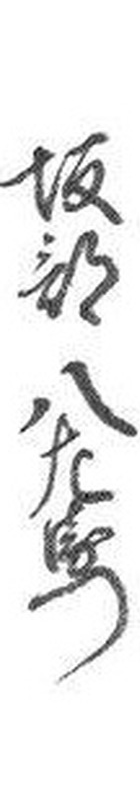坂部八左衛門
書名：家譜 四 忠昌公 従寛永七年到正保四年
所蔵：福井県文書館 Fukui Prefectural Archives
